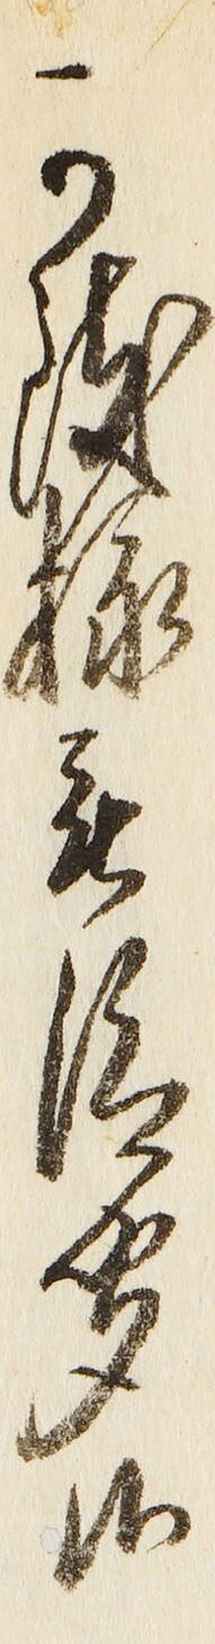可致様被仰聞候
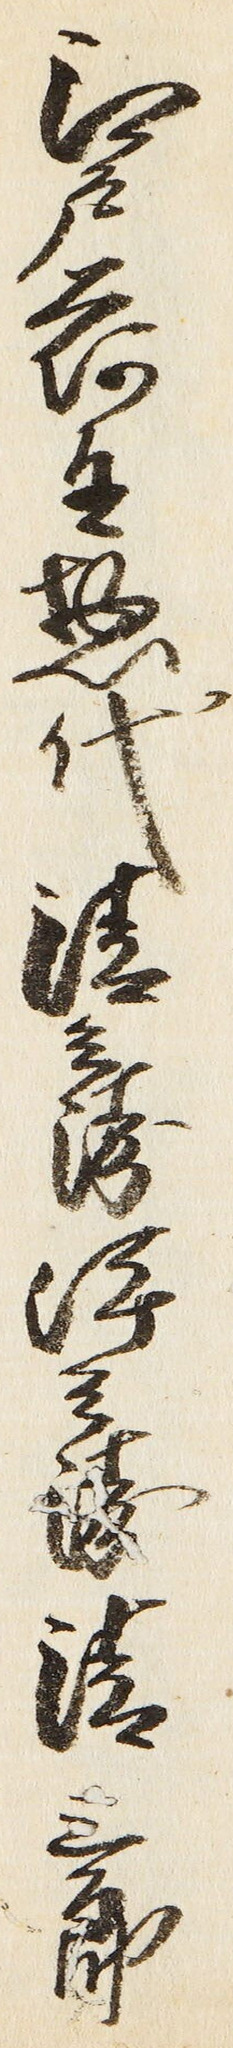一江戸荷主惣代清兵衛伊兵衛清三郎
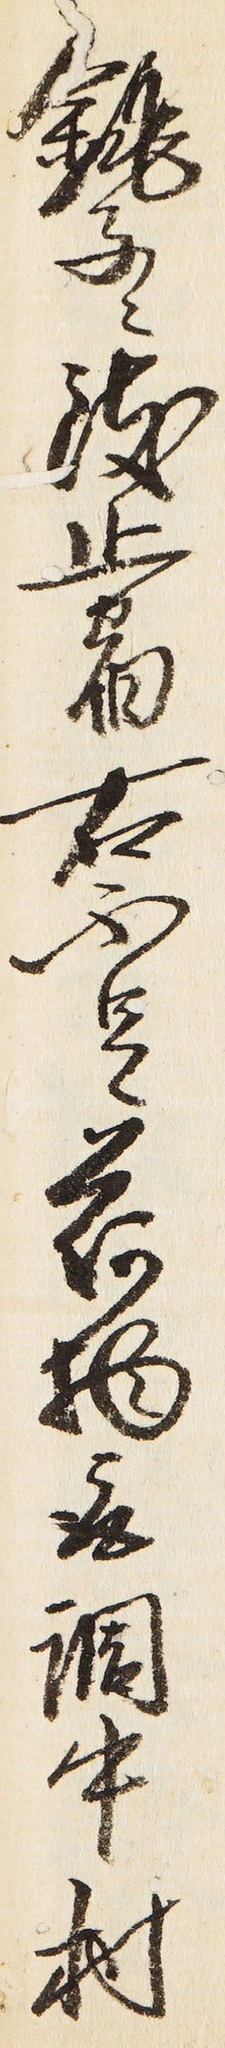銚子ニ致止宿右不足荷物取調中村
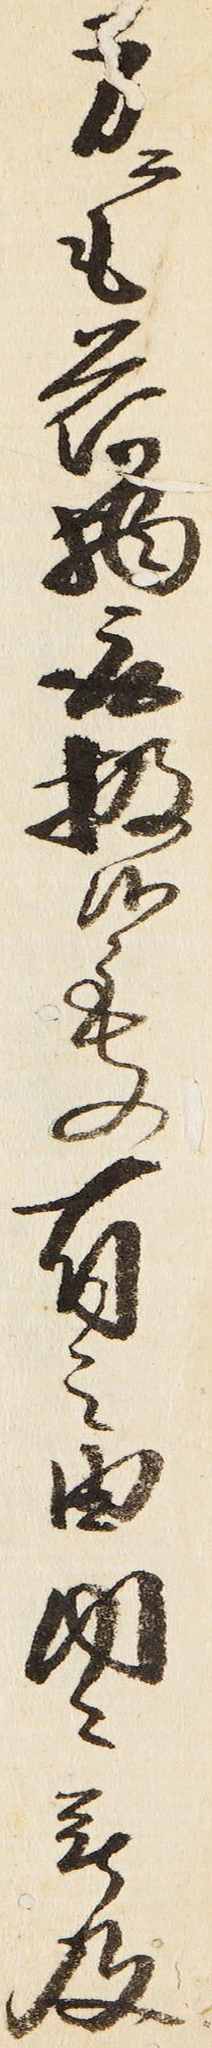方ニも荷物取扱候もの有之由内々被及
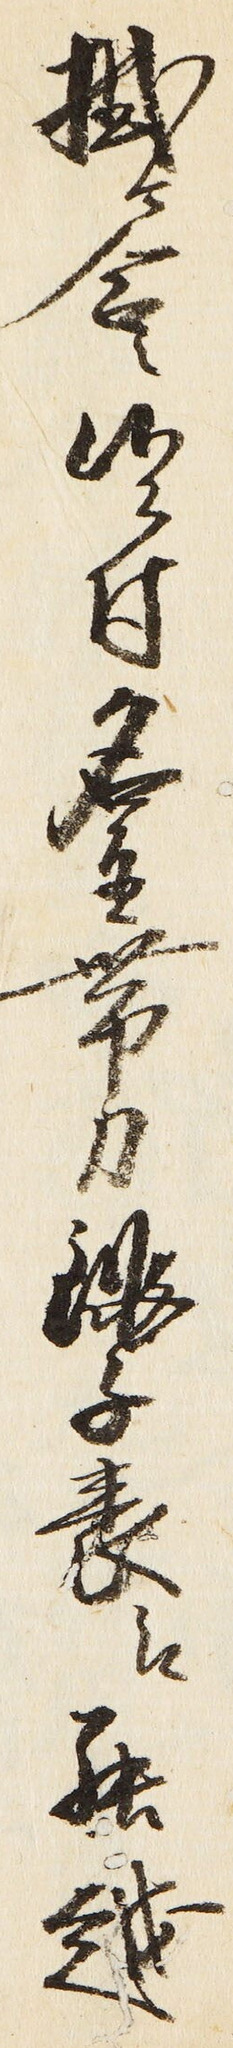掛合候ニ付名主帯刀銚子表江罷越
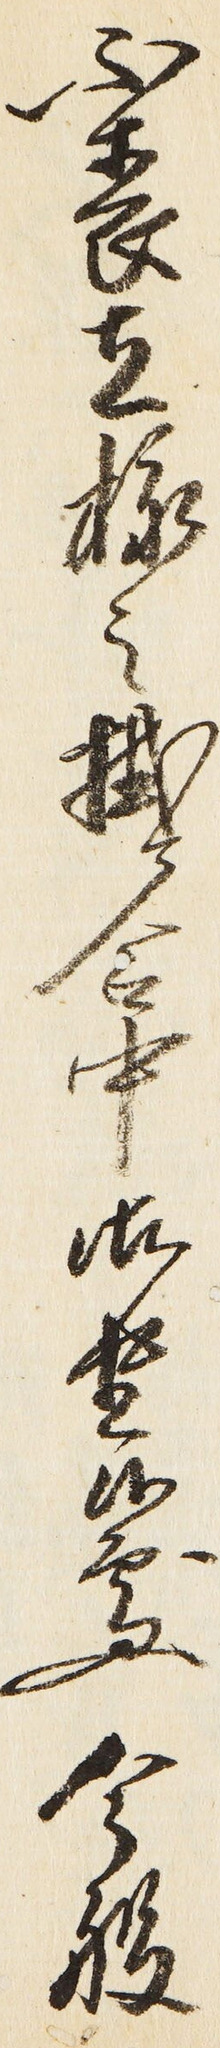不表立様之掛合中御座候処今般
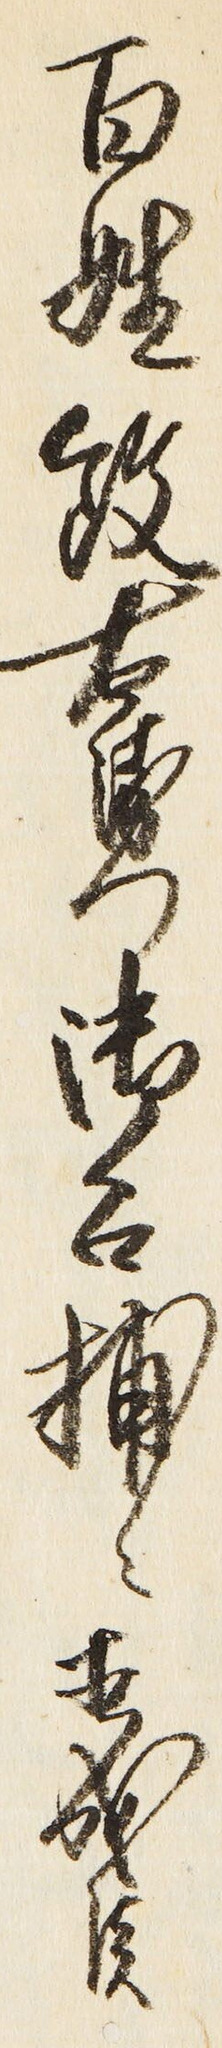百姓政右衛門御召捕ニ相成候
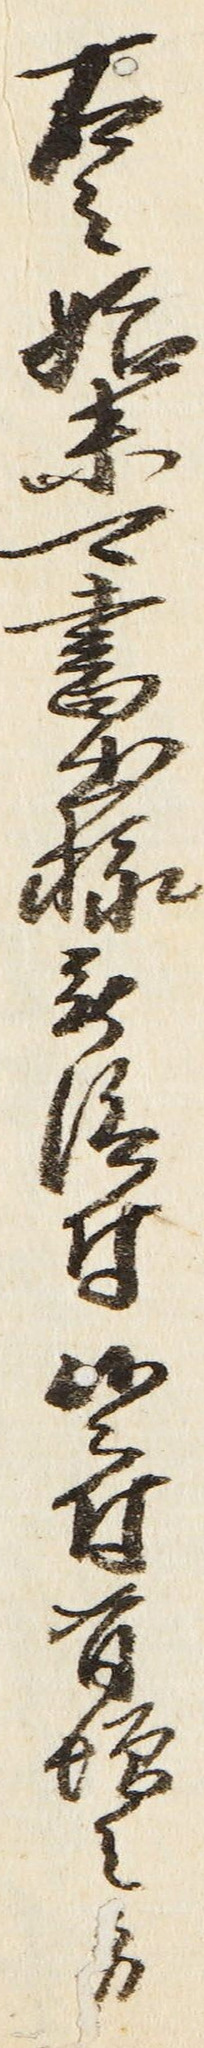右之始末可書出様被仰付候ニ付有増之方
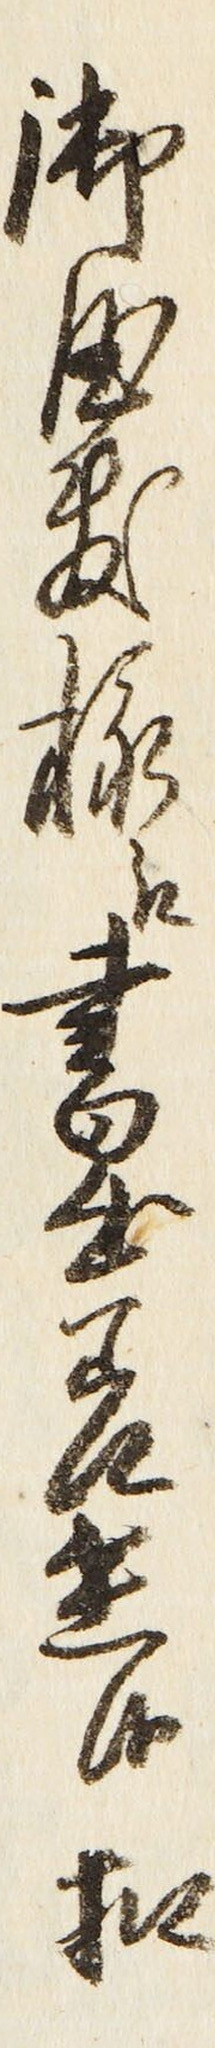御屋敷様江書出差遣候控
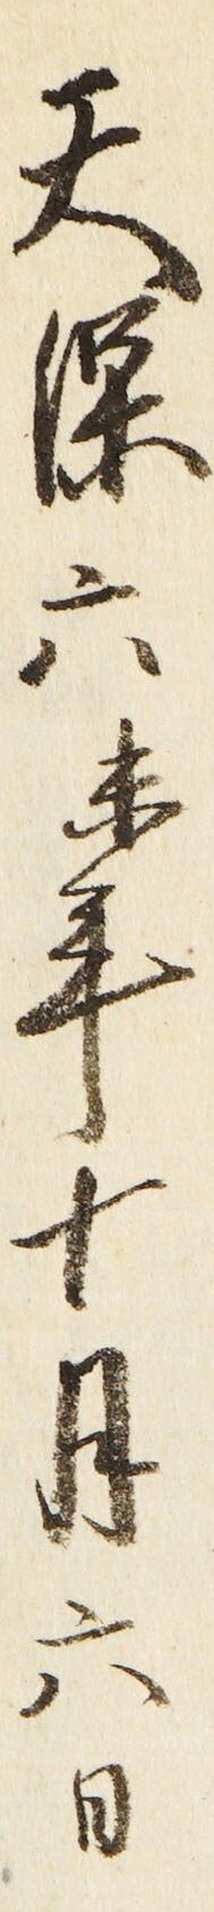天保六未年十月六日

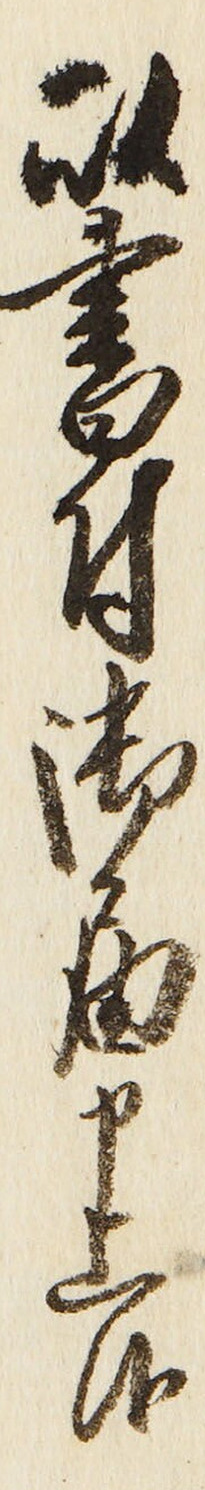以書付御届申上候
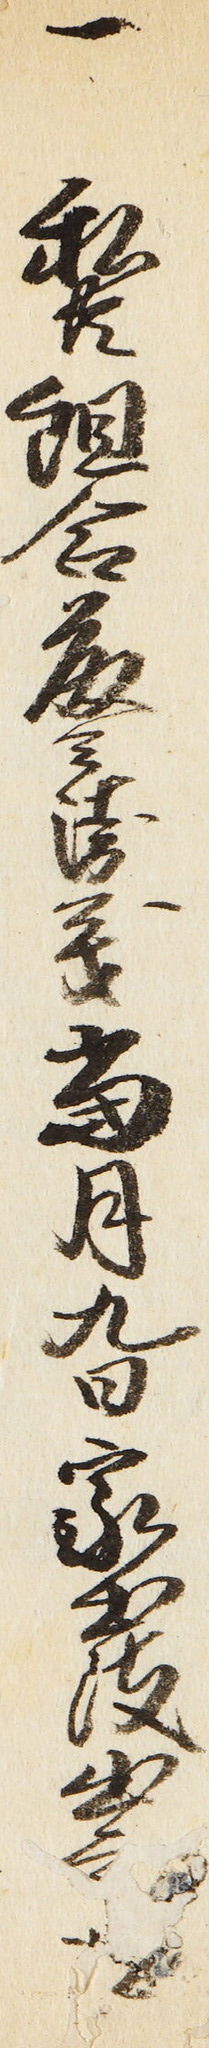一私共組合藤兵衛義当月九日家出致出
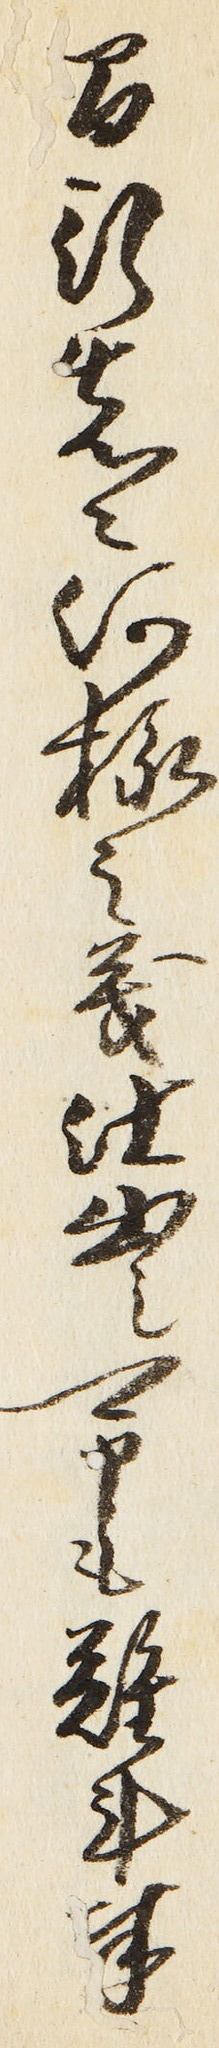間行先ニ何様之義仕出し可申も難計奉
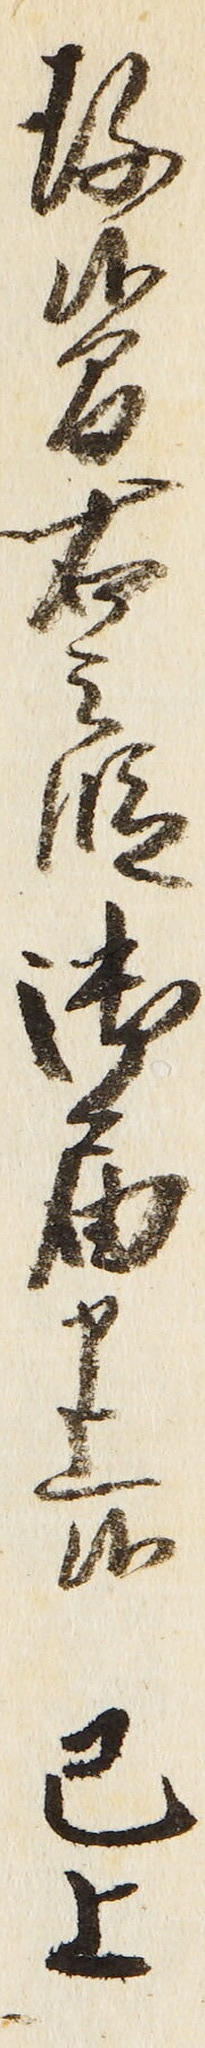存候間右之段御届申上候已上
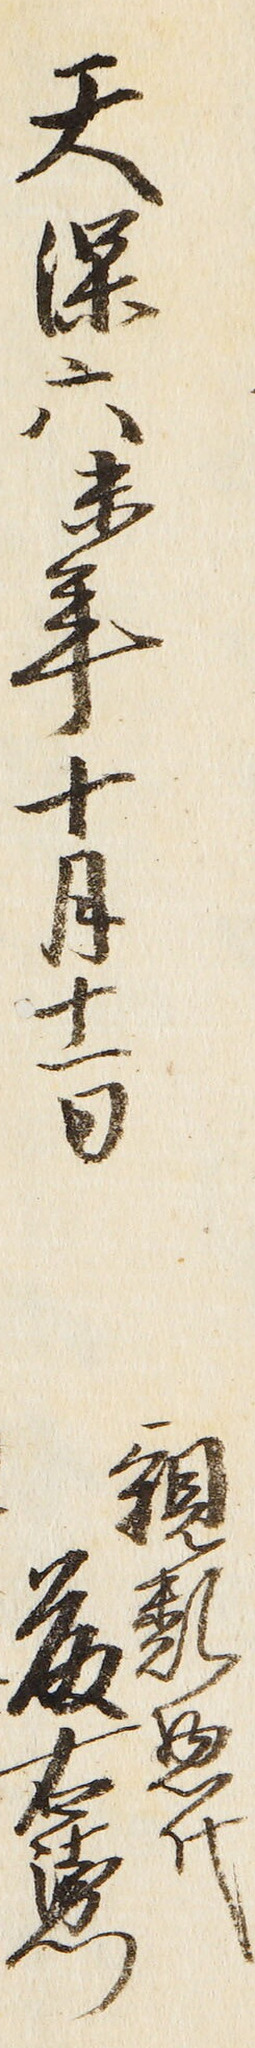天保六未年十月十一日親類惣代
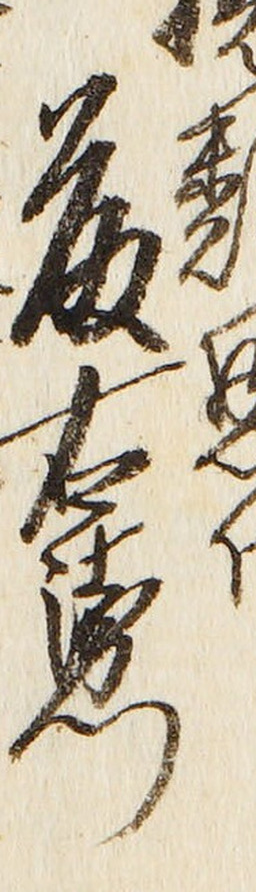藤右衛門
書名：難船一件記録
